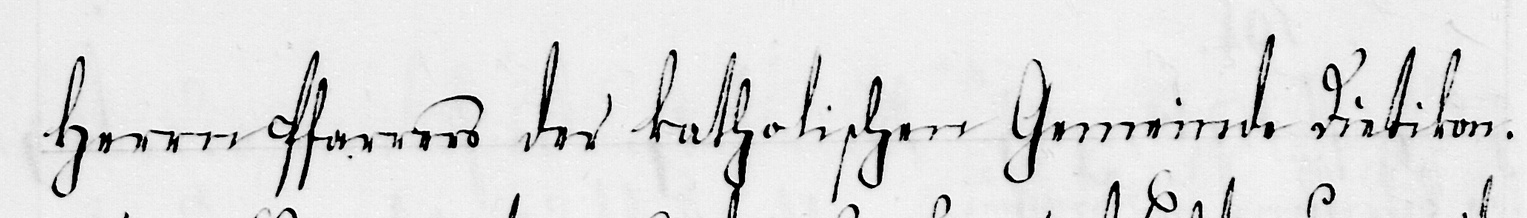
Herrn Pfarrers der katholischen Gemeinde Dietikon.
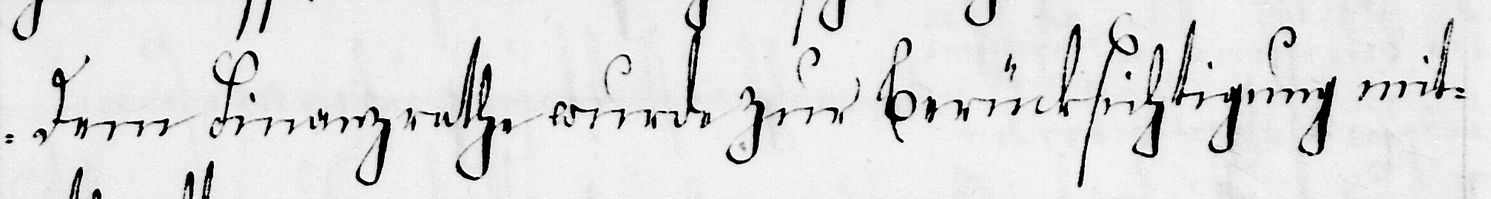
Dem Finanzrathe wurde zur Berücksichtigung mit¬
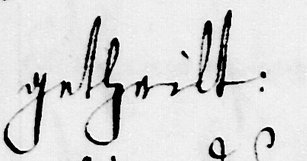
getheilt:
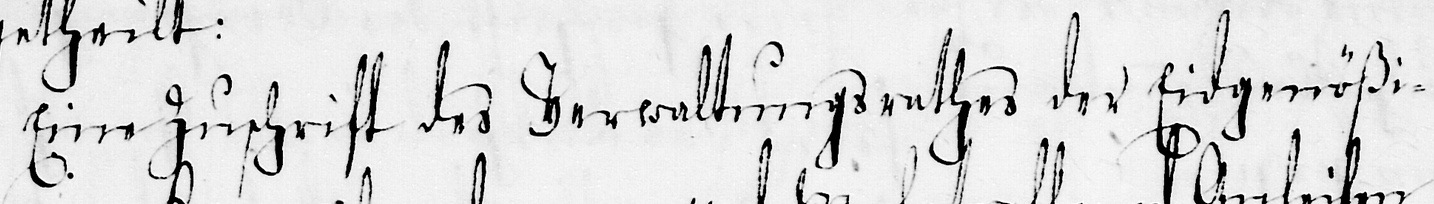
Eine Zuschrift des Verwaltungsrathes der Eidgenößi¬
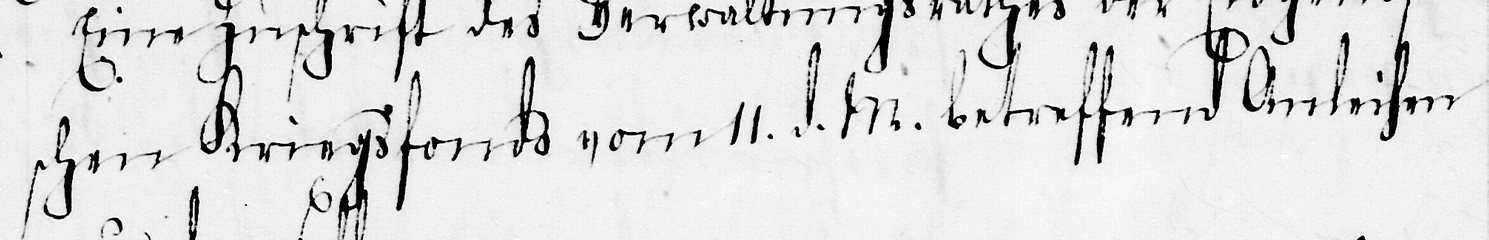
schen Kriegsfonds vom 11. d. M. betreffend Anleihen
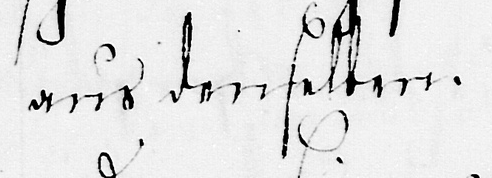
aus denselben.
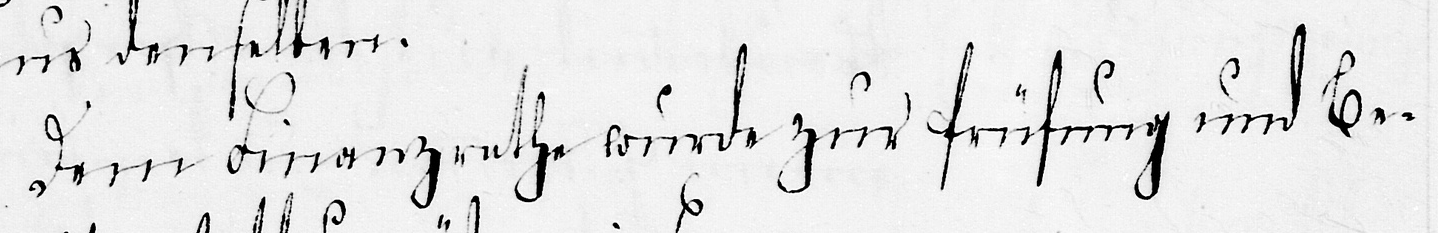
Dem Finanzrathe wurde zur Prüfung und Be¬
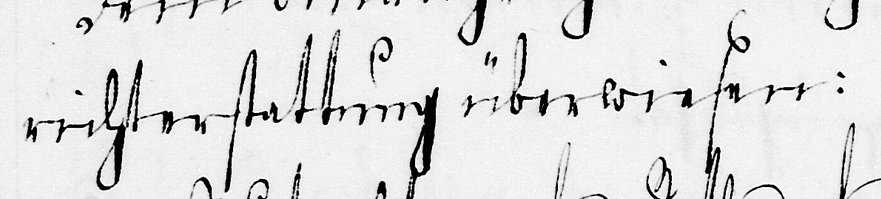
richterstattung überwiesen:
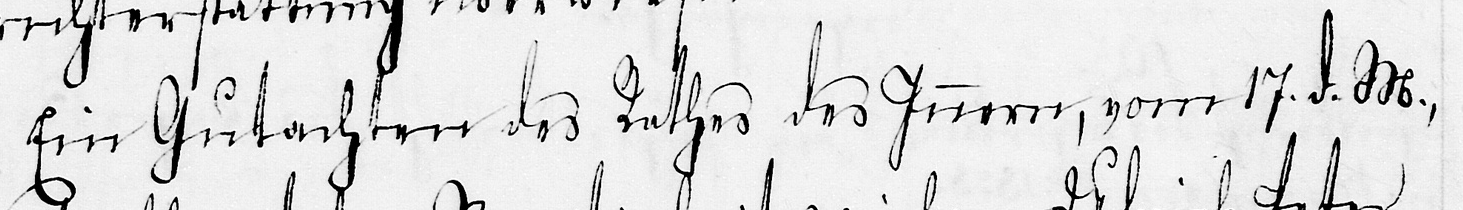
Ein Gutachten des Rathes des Innern, vom 17. d. M.,
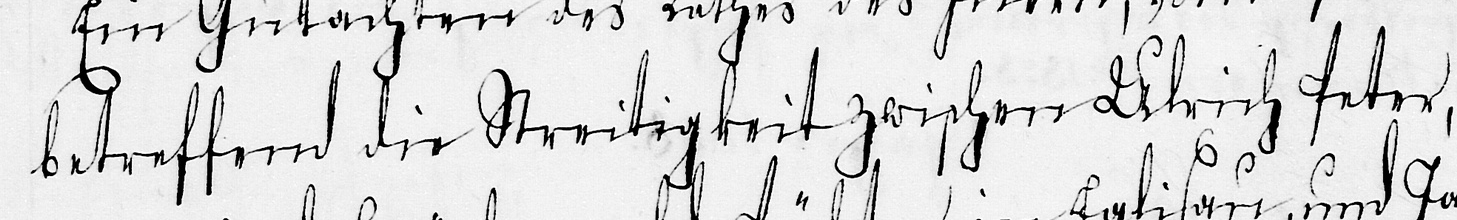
betreffend die Streitigkeit zwischen Ulrich Peter,
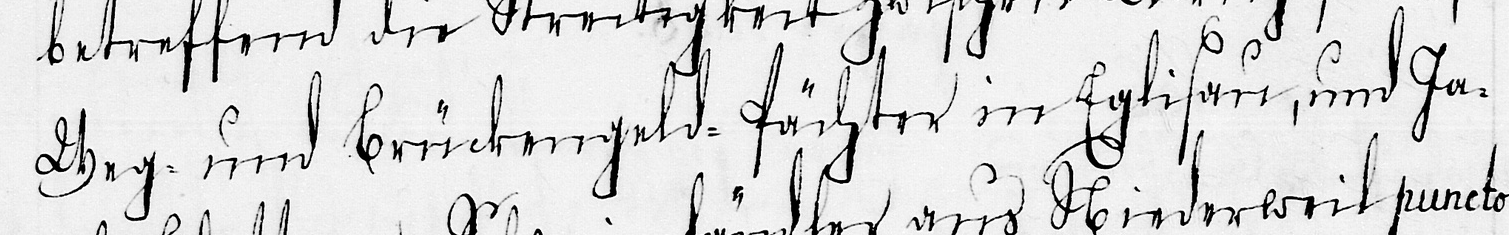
Weg- und Brückengeld-Pächter in Eglisau, und Ja¬
